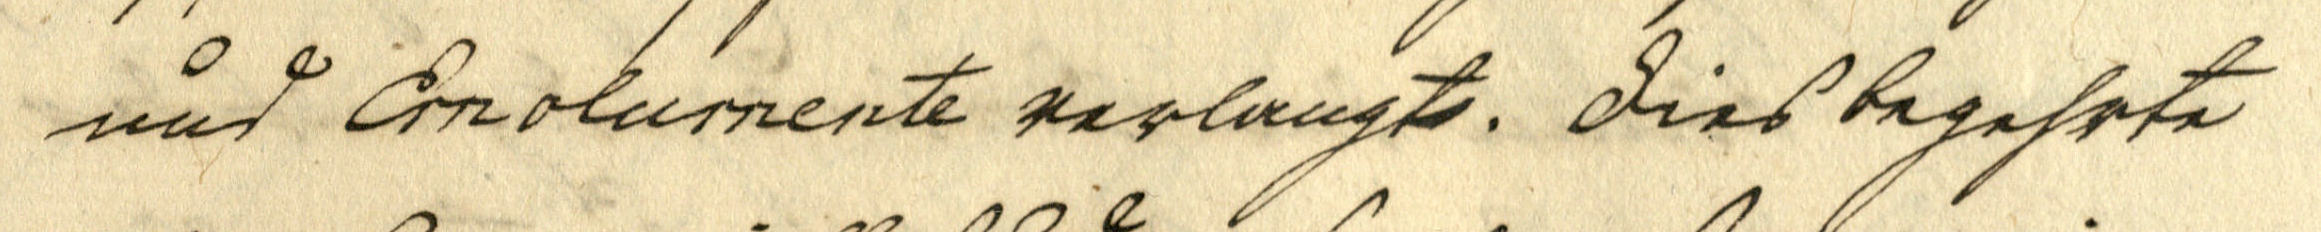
und Emolumente verlangt. Dies begehrte
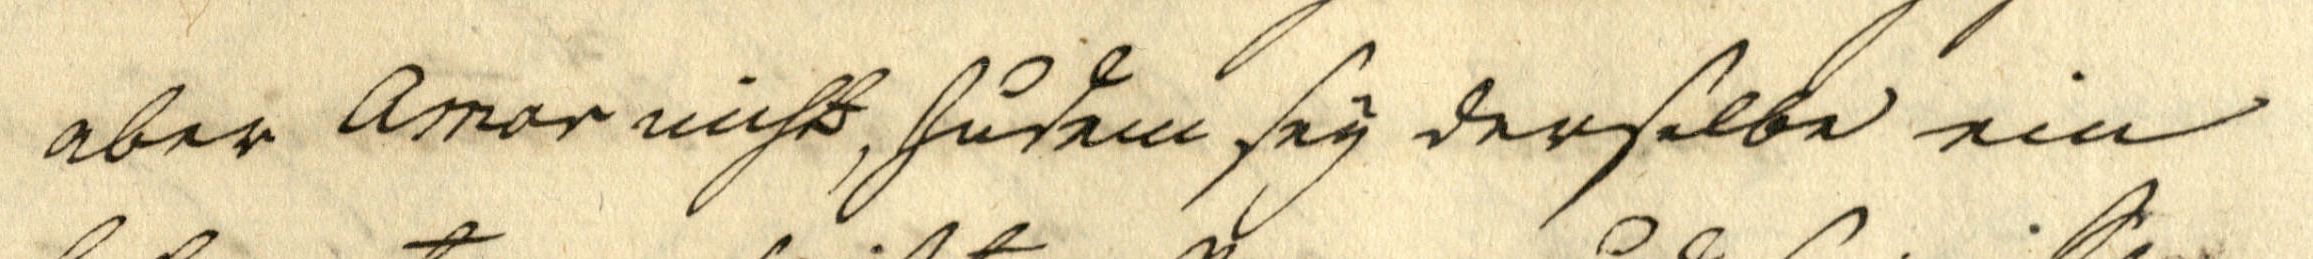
aber Amor nicht, zudem sey derselbe ein
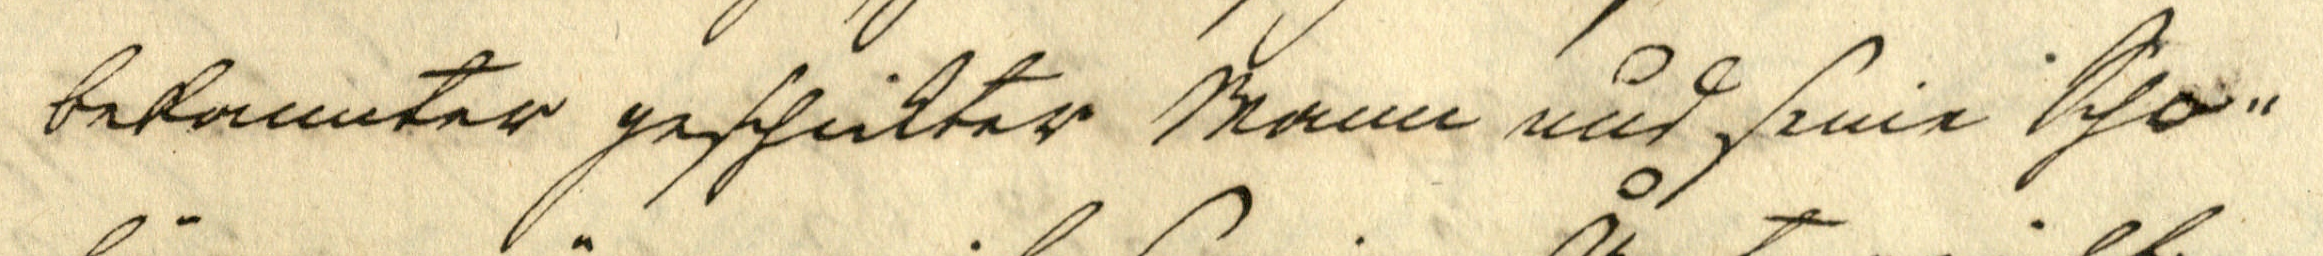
bekannter geschickter Mann und seine Scho-
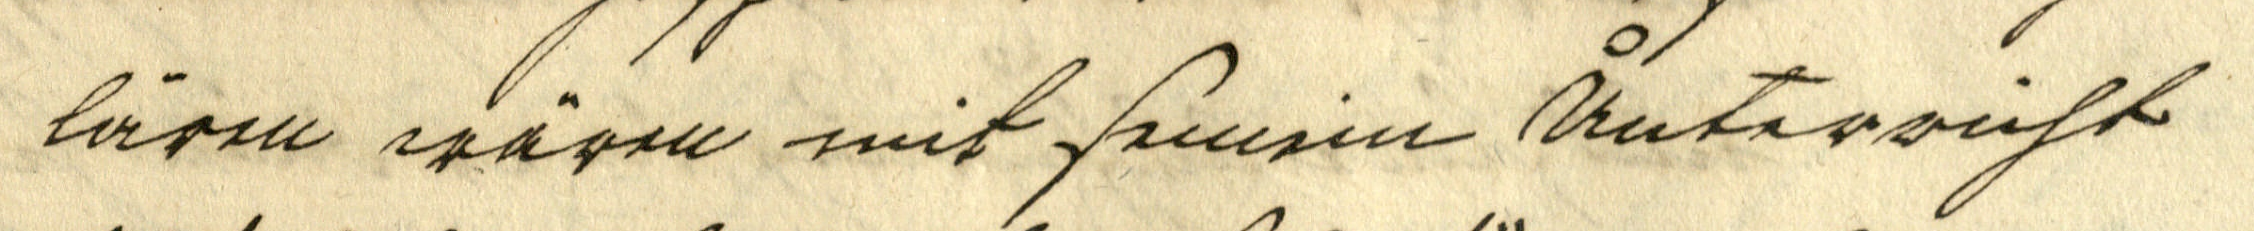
laren wären mit seinem Unterricht
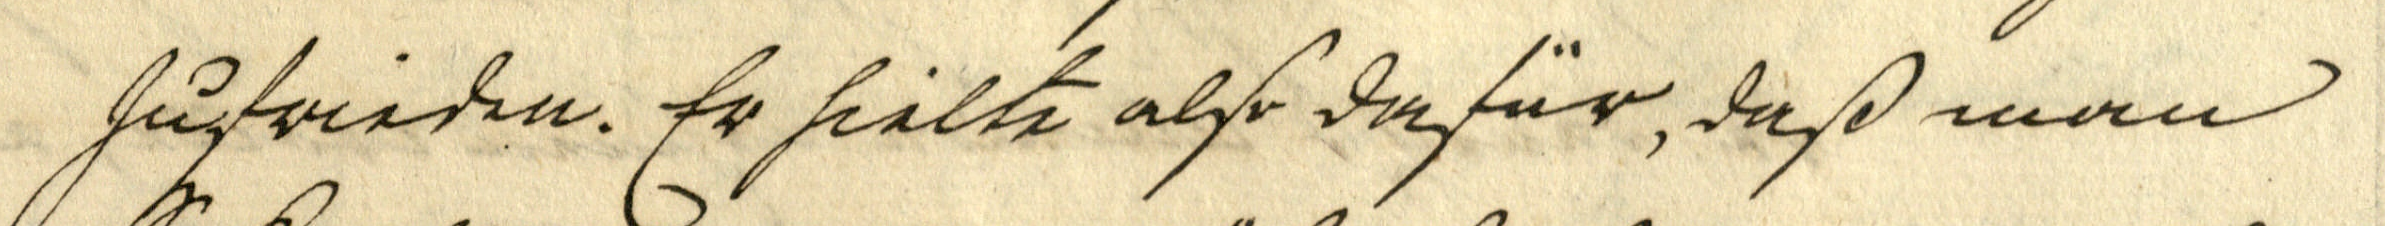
zufrieden. Er hielte also dafür, daß man
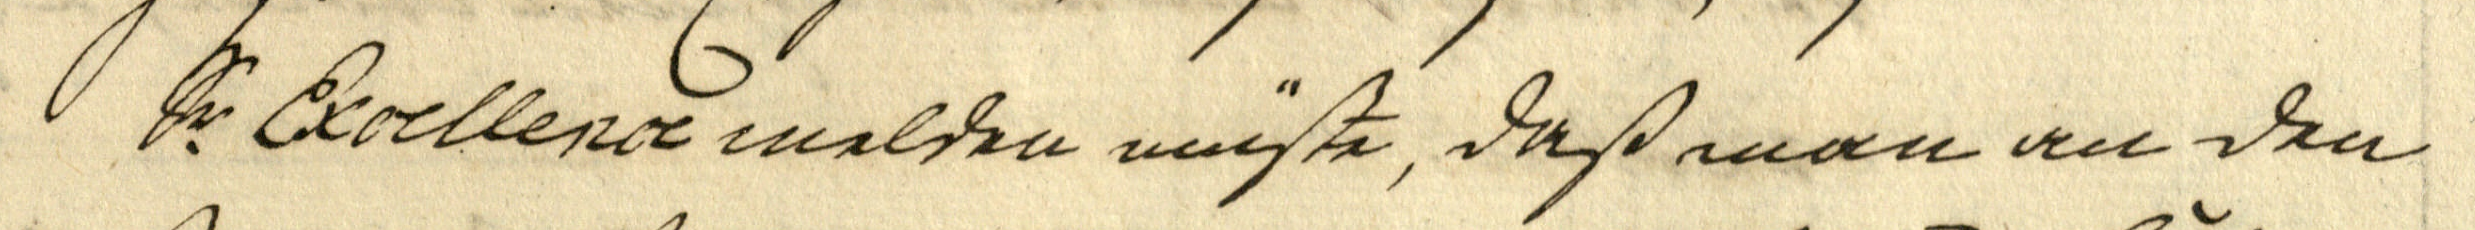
Sr. Excellence melden müßte, daß man an den
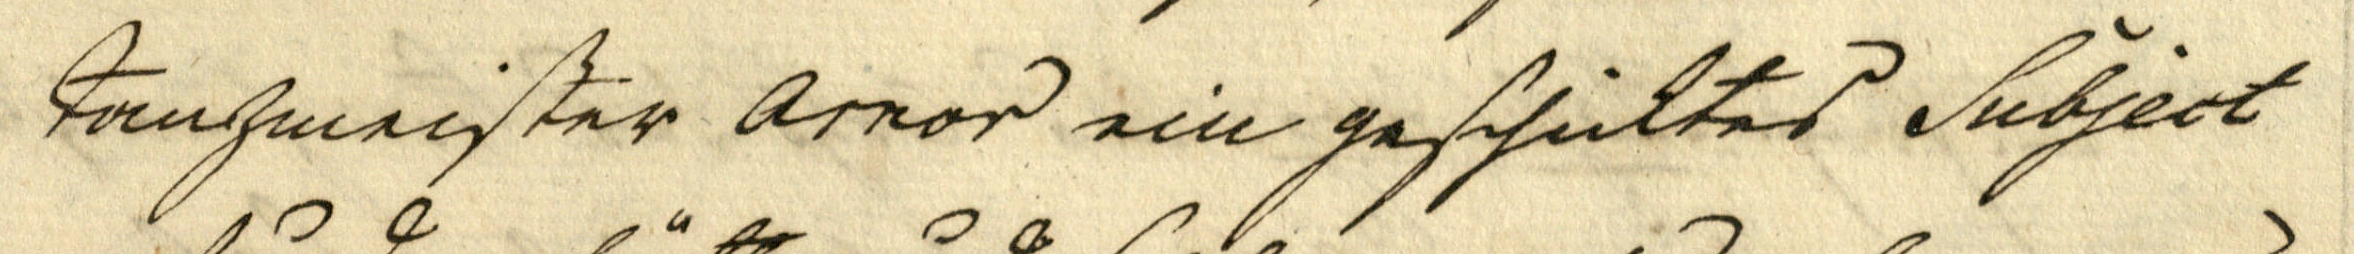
Tanzmeister Amor ein gechicktes Subject
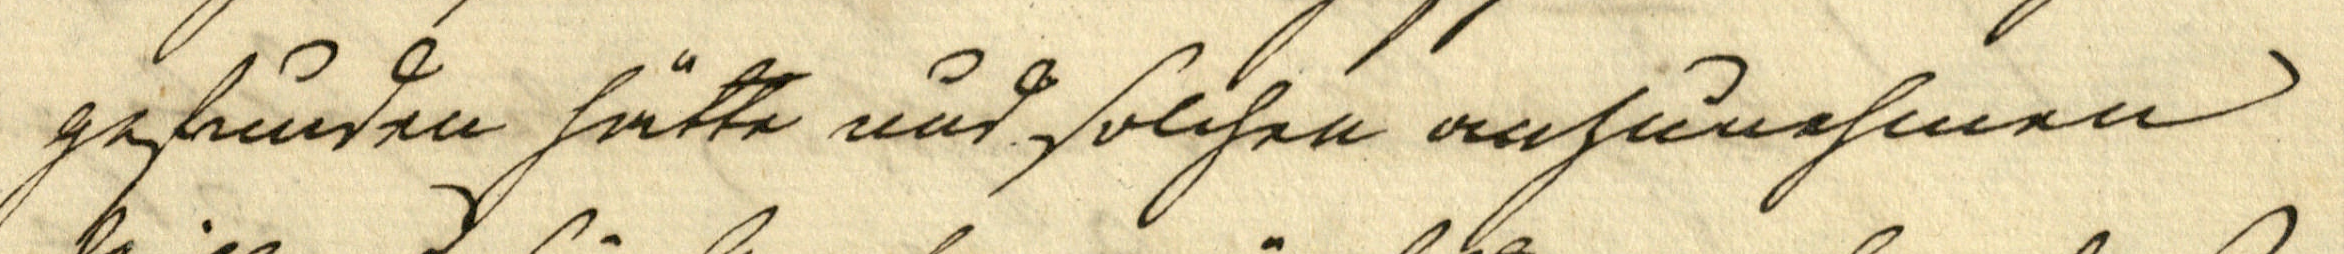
gefunden hätte und solchen anzunehmen
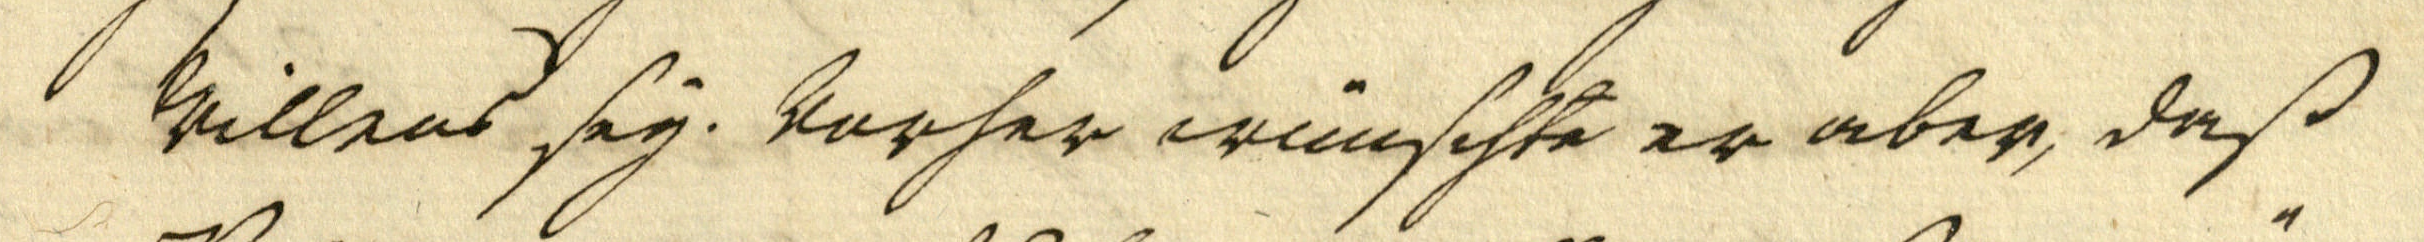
Willens sey. Vorher wünschte er aber, daß
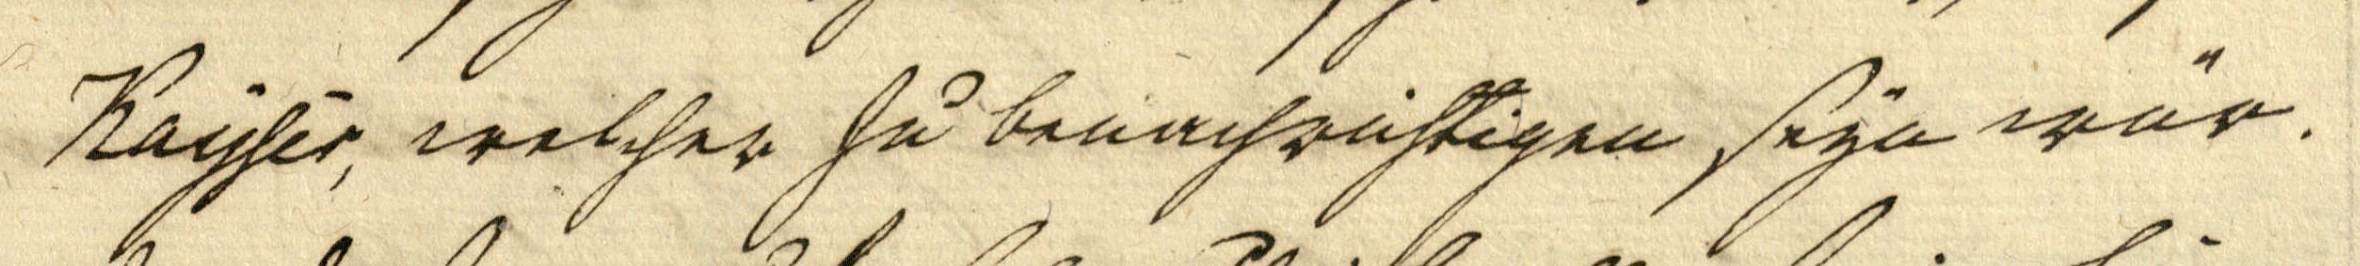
Kayser, welcher zu benachrichtigen seyn wür-
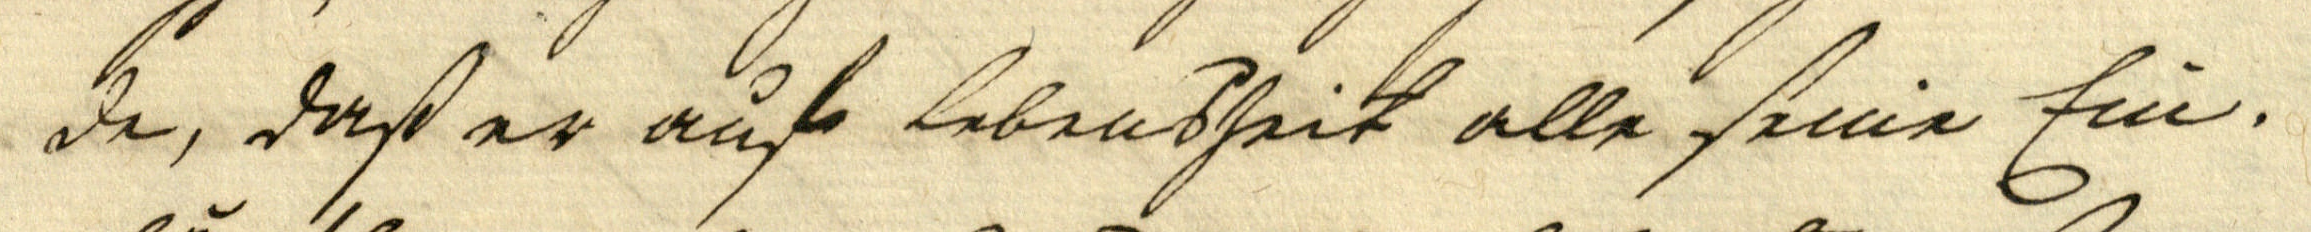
de, daß er auf Lebenszeit alle seine Ein-
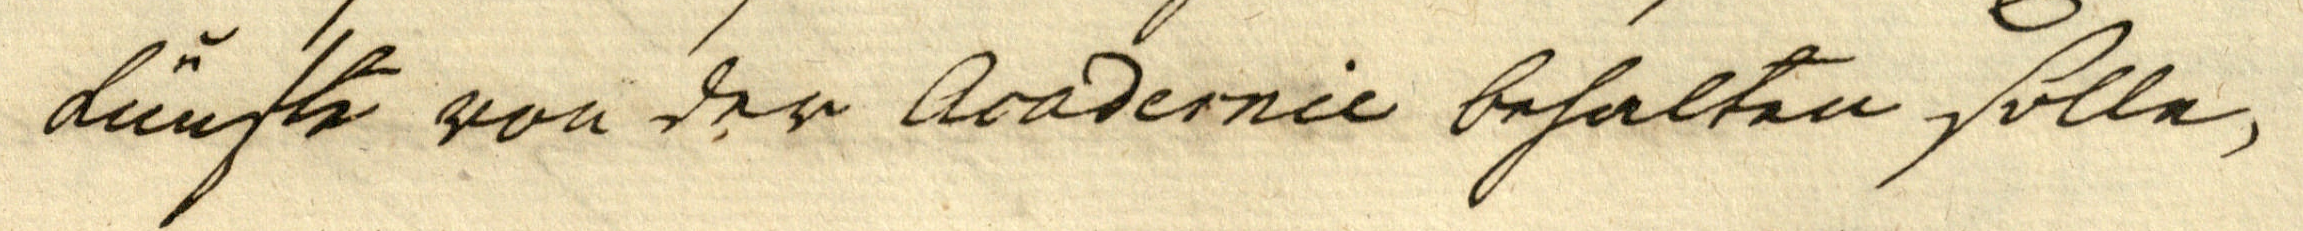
künfte von der Academie behalten solle,
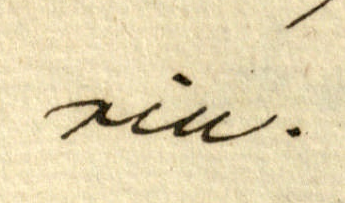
ein-
